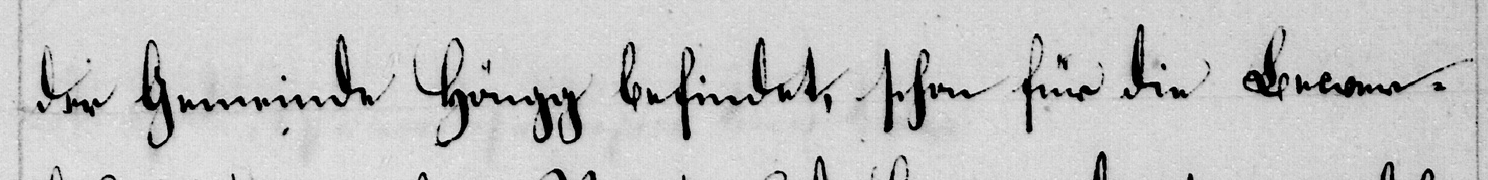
der Gemeinde Höngg befindet, schon für die Bewer¬
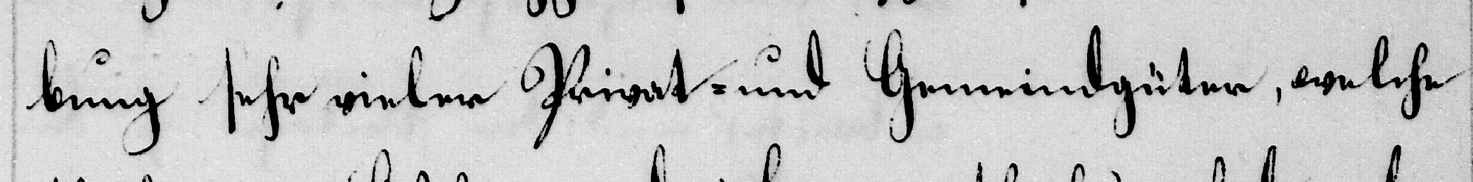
bung sehr vieler Privat- und Gemeindgüter welche
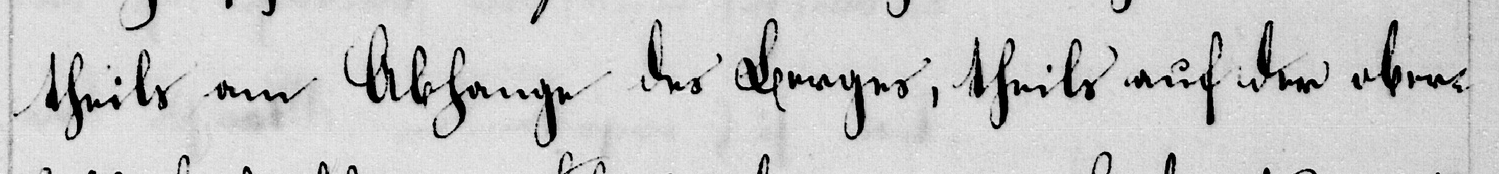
theils am Abhange des Berges, theils auf der ober¬
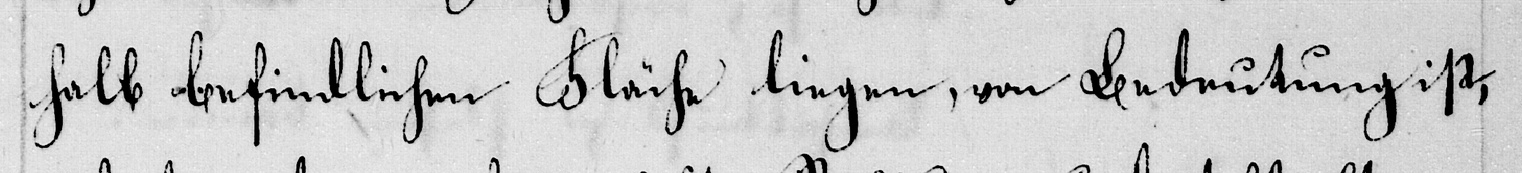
halb befindlichen Fläche liegen, von Bedeutung ist,
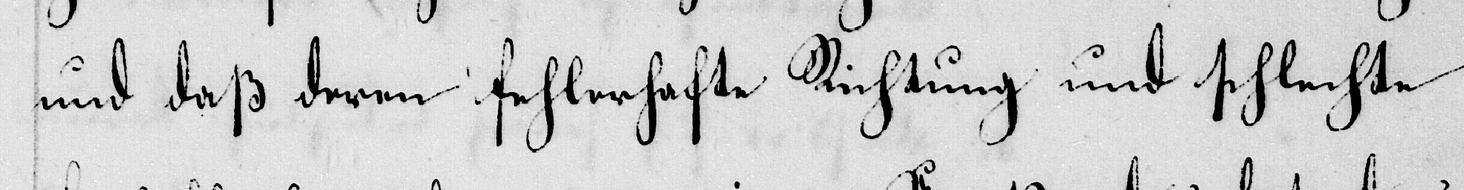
und daß drum fehlerhafte Richtung und schlechte
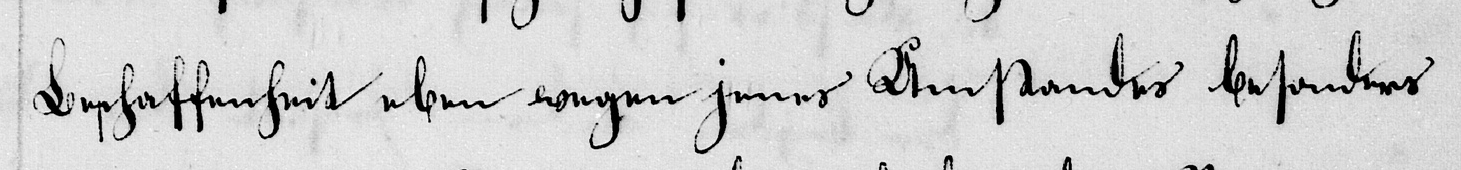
Beschaffenheit eben wegen jenes Umstandes besonders
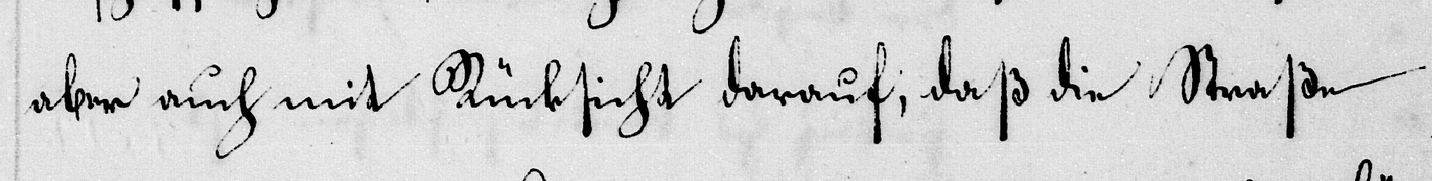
aber auch mit Rücksicht darauf, daß die Straße
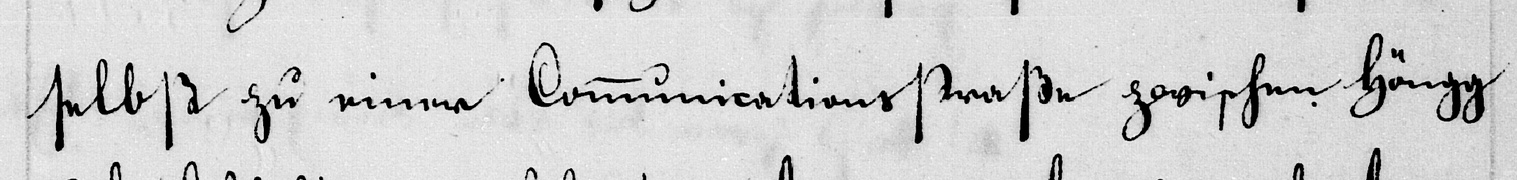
selbst zu einer Communicationsstraße zwischen Höngg
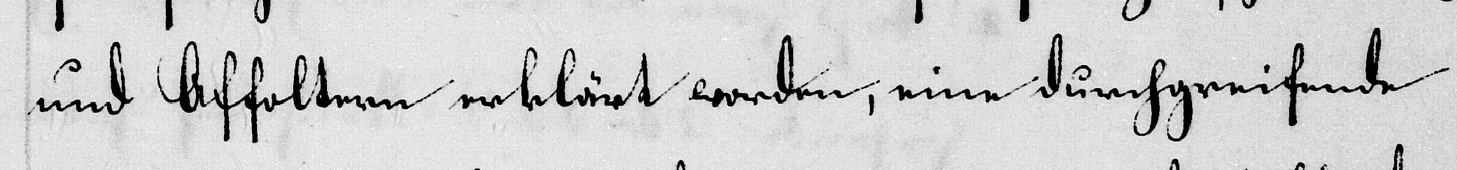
und Affoltern erklärt worden, eine durchgreifende
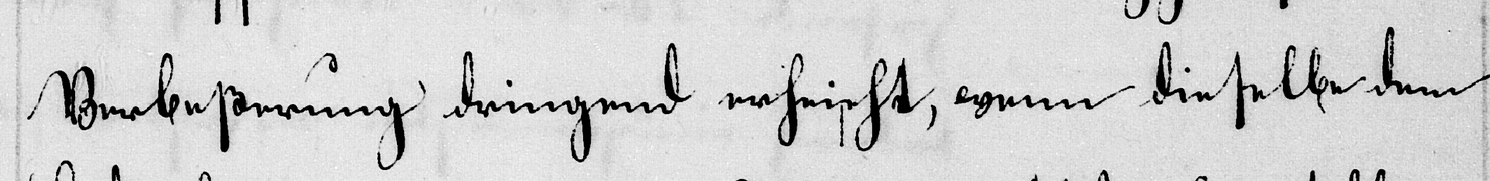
Verbeßerung dringend erheischt, wenn dieselbe dem
